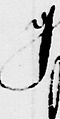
s¬
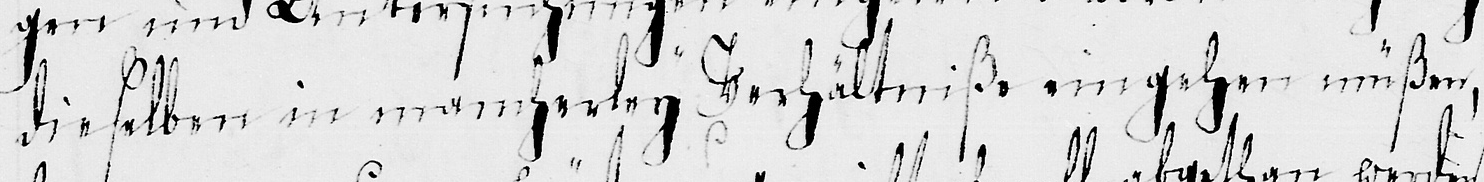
dieselben in mancherley Verhältniße eingehen müßen,
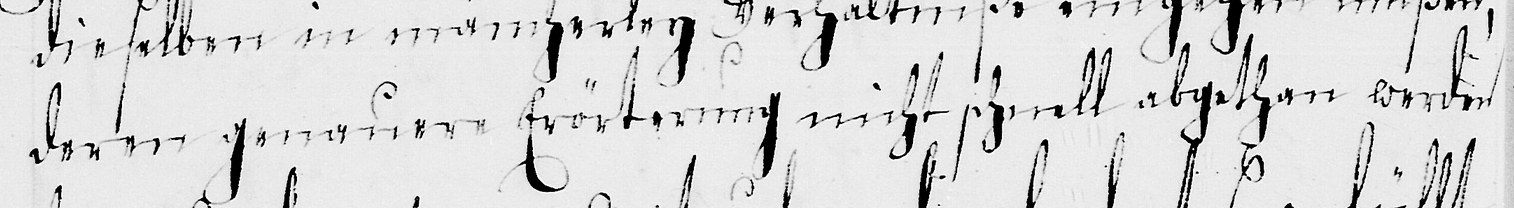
deren genauere Erörterung nicht schnell abgethan werden
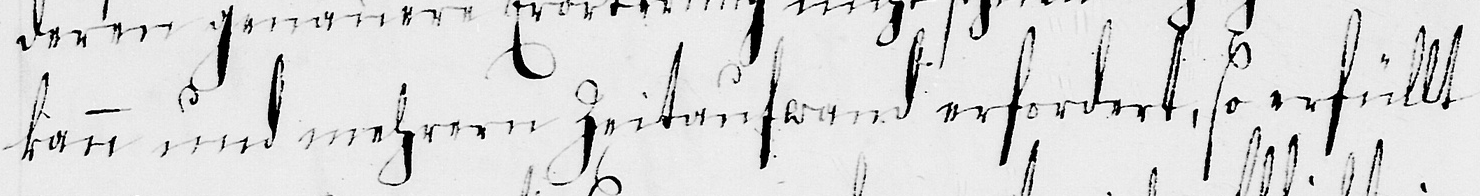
kann und mehrern Zeitaufwand erfordert, so erfüllt
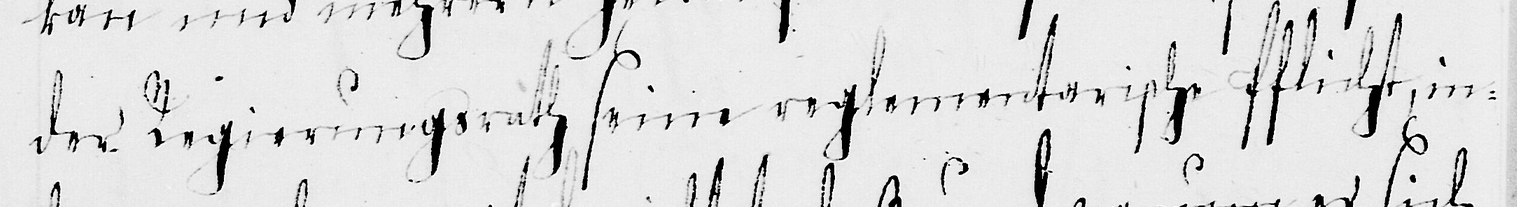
der Regierungsrath seine reglementarische Pflicht, in¬
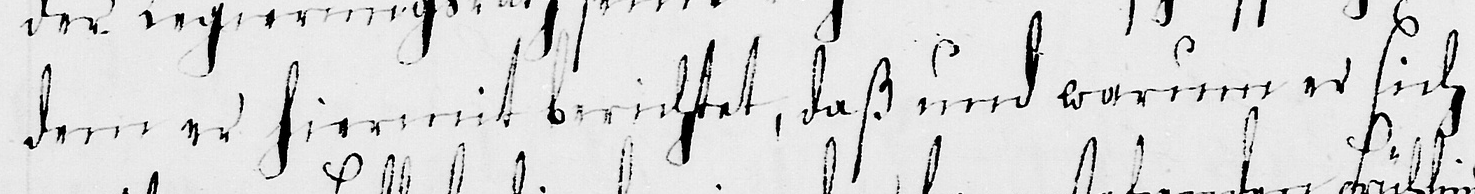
dem er hiermit berichtet, daß und warum er sich
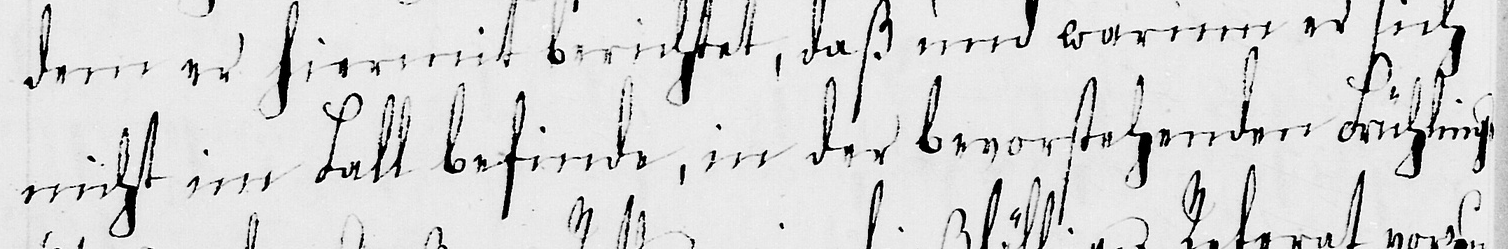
nicht im Fall befinde, in der bevorstehenden Frühling¬
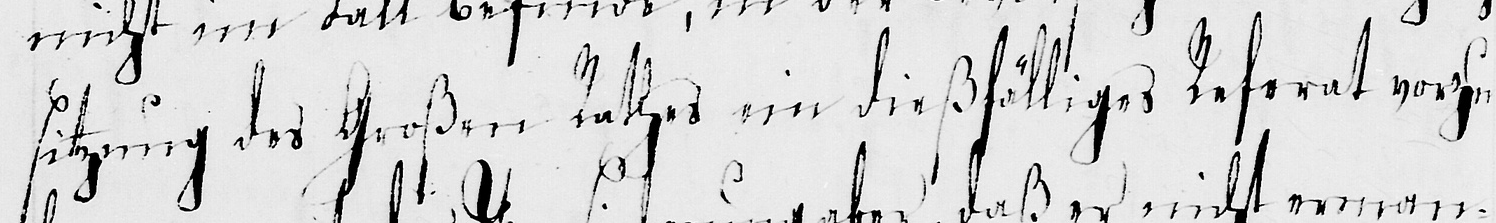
sitzung des Großen Rathes ein dießfälliges Referat vorz¬
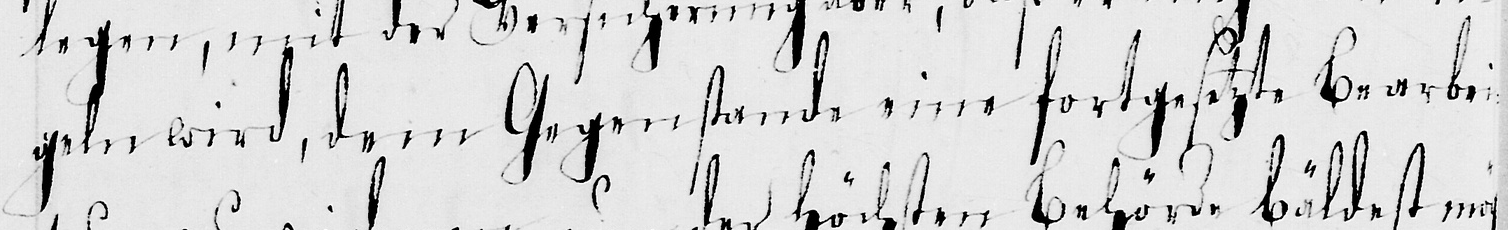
geln wird, dem Gegenstande eine fortgesetzte Bearbei¬
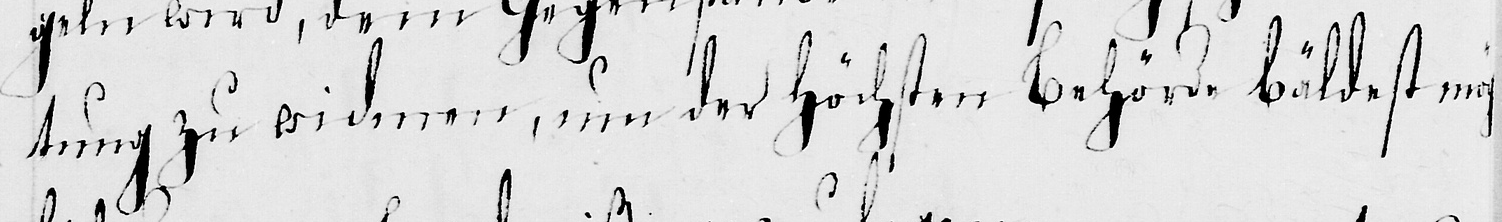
tung zu widmen, um der Höchsten Behörde bäldest mö¬
